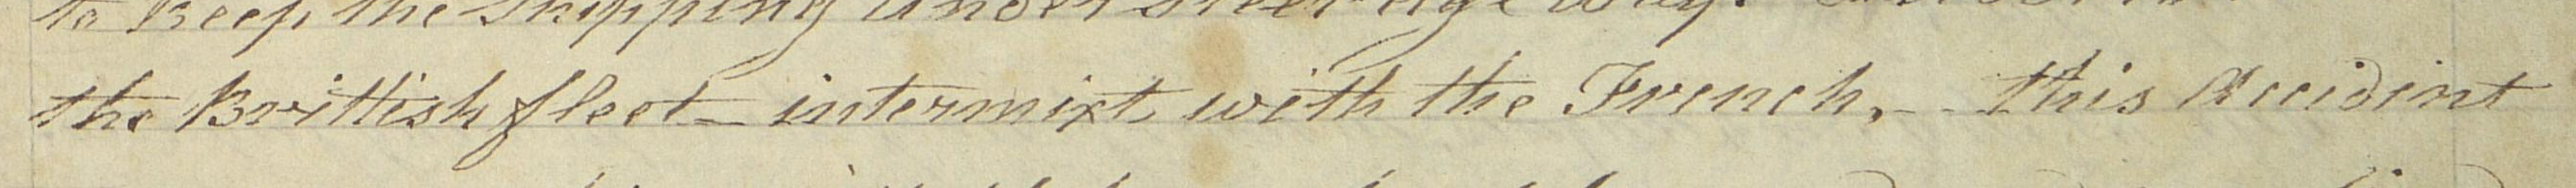the Brittish fleet- intermixt with the French, This accident
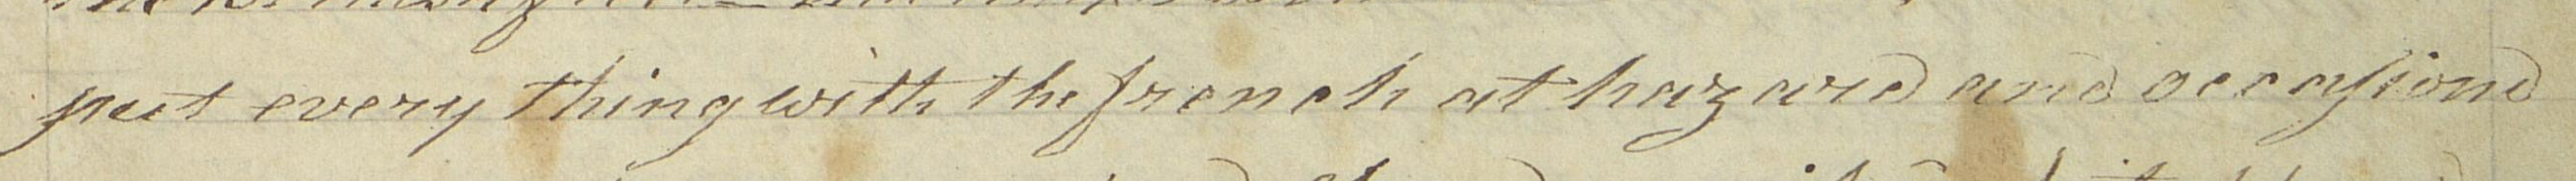put every thing with the french at hazard and occassiond
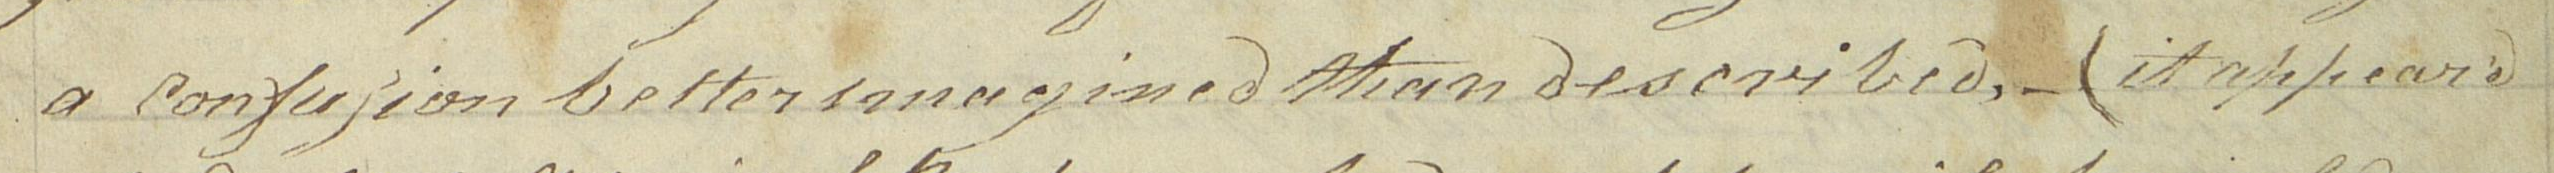a confusion better imagined than described, (it appear'd
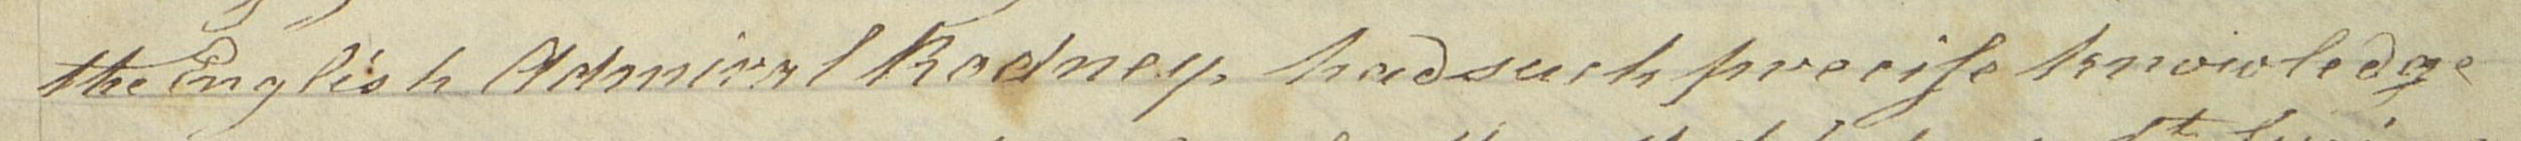the English Admiral Rodney, had such precise knowledge
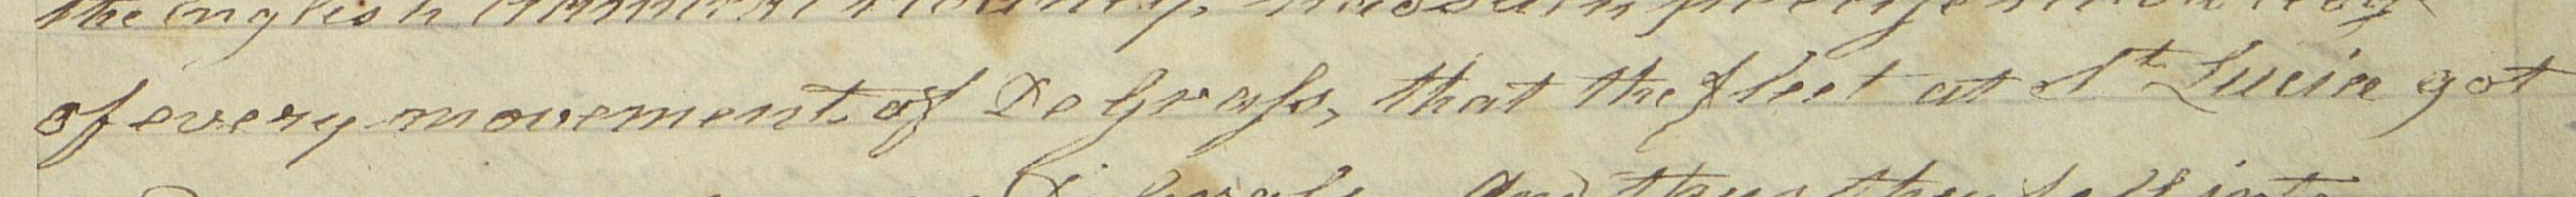of every movement of DeGrass, that the fleet at S^t. Lucia got
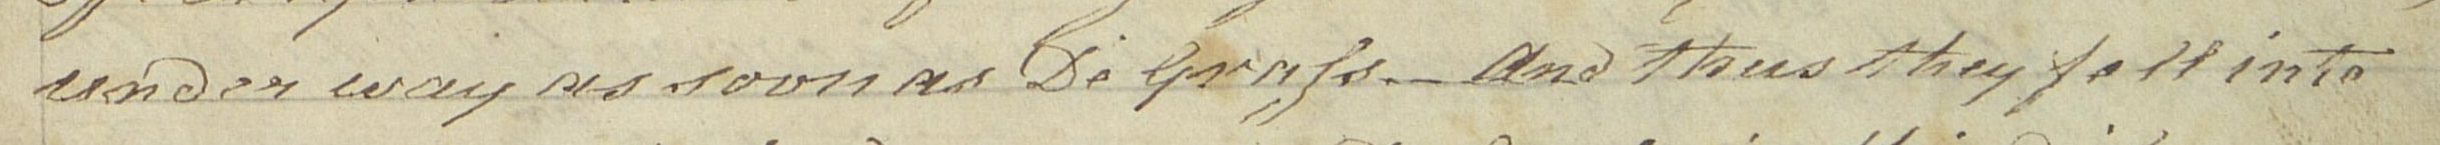under way as soon as De Grass, And thus they fall into
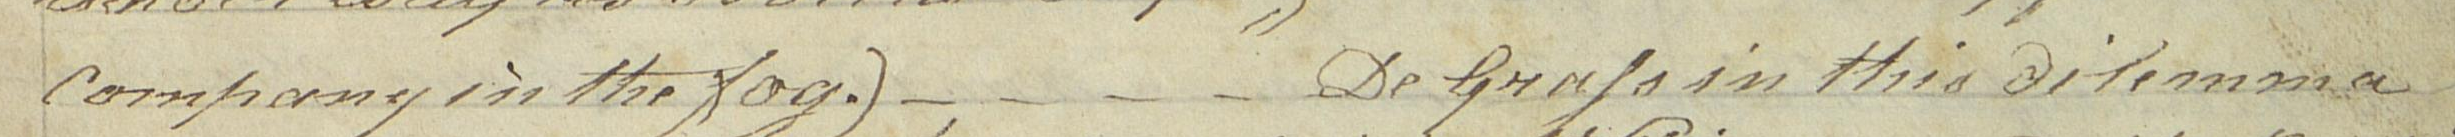company in the fog.) De Grass in this dilemma
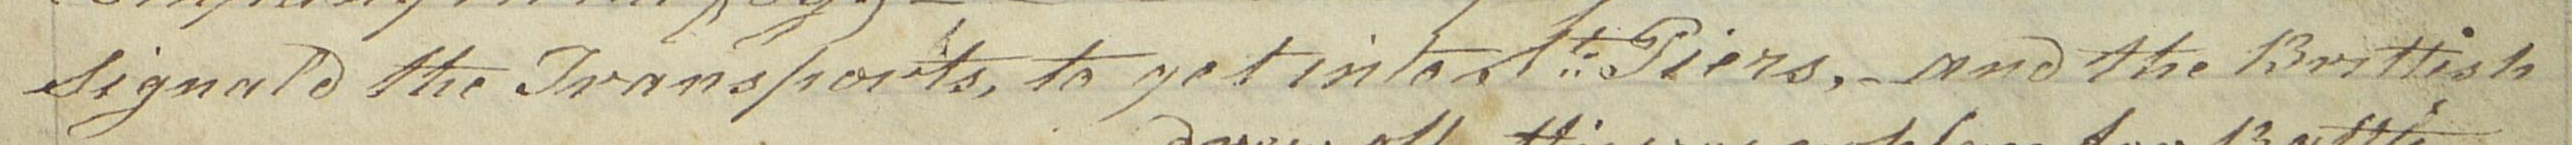signald the Transports, to get into S^t. Piers, and the Brittish
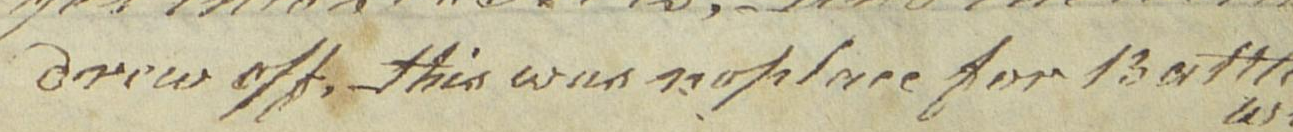drew off, this was no place for Battle
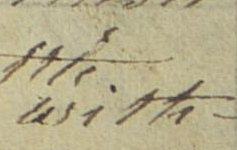with
